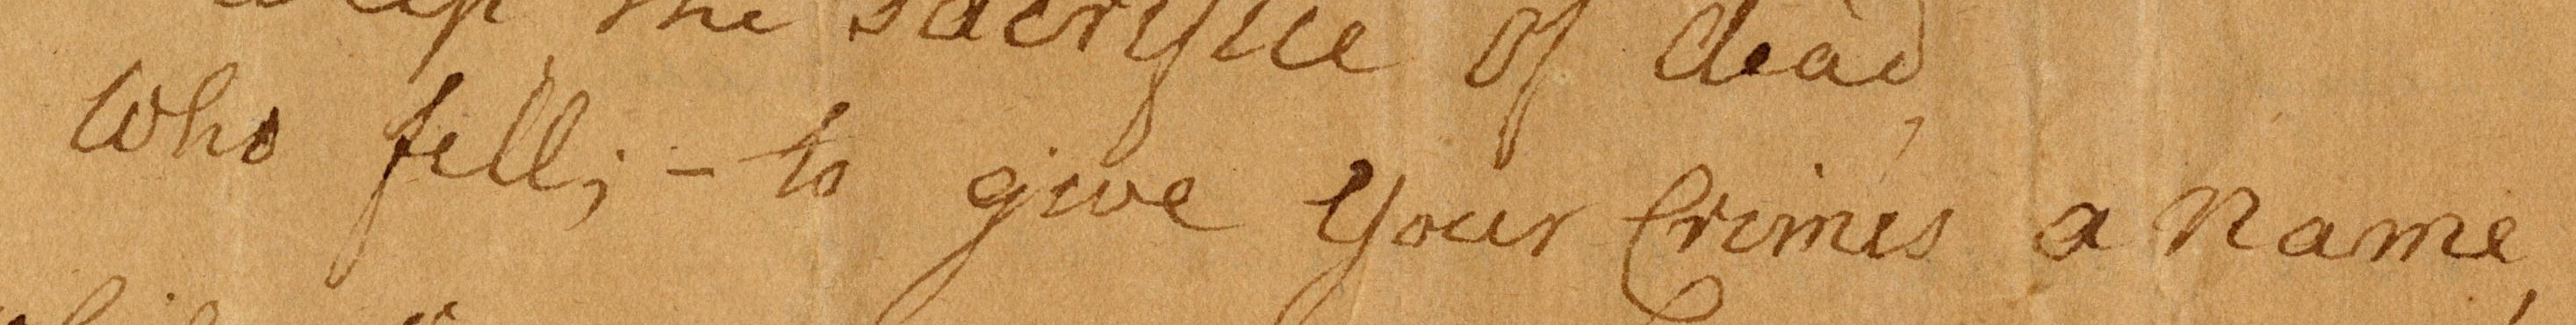Who fell; -to give Your Crimes a Name,
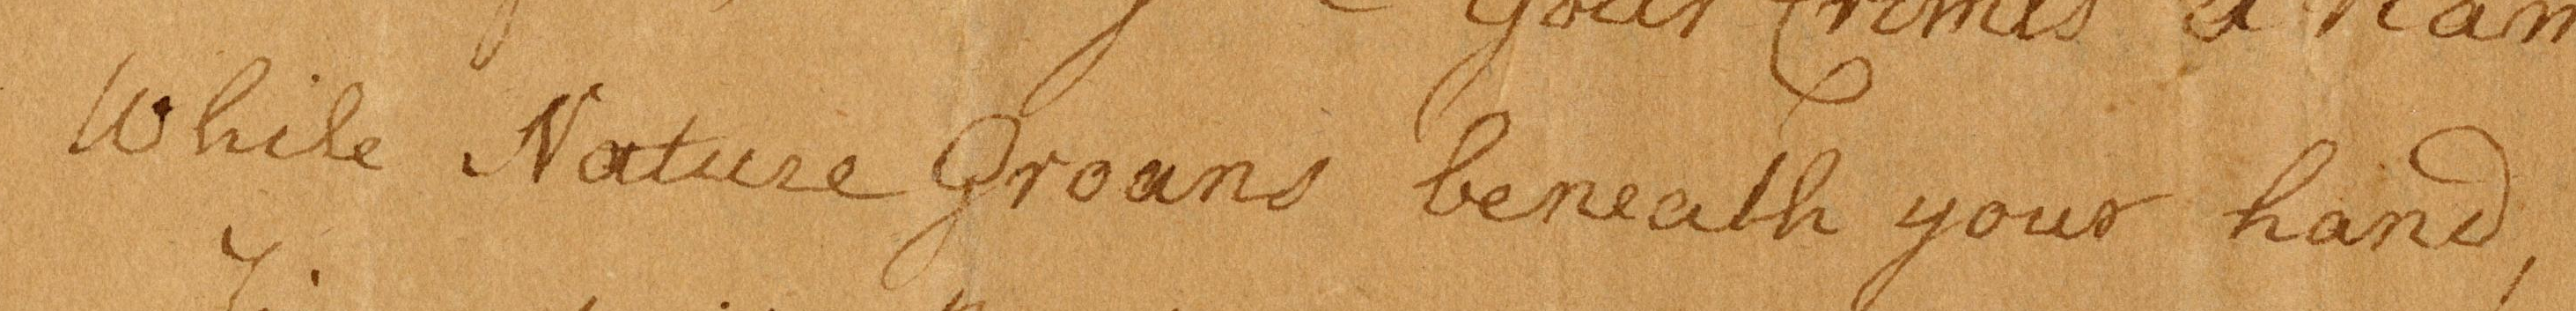While Nature Groans beneath your hand,
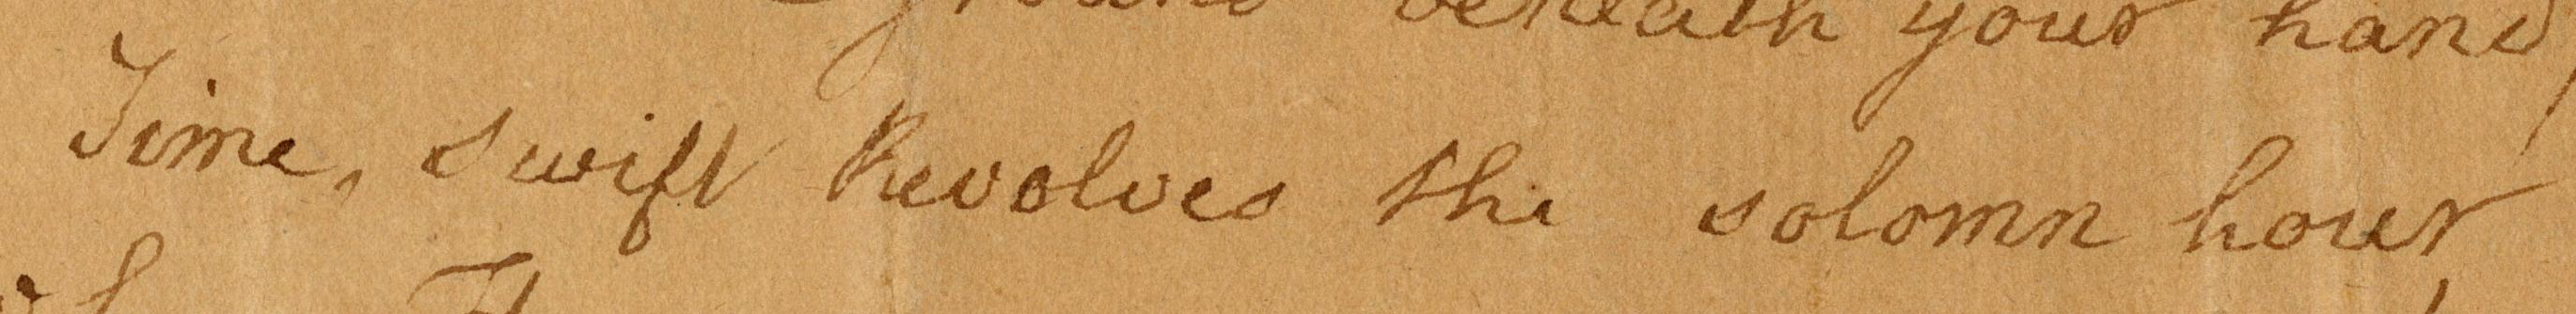Time, Swift Revolves the solomn hour,
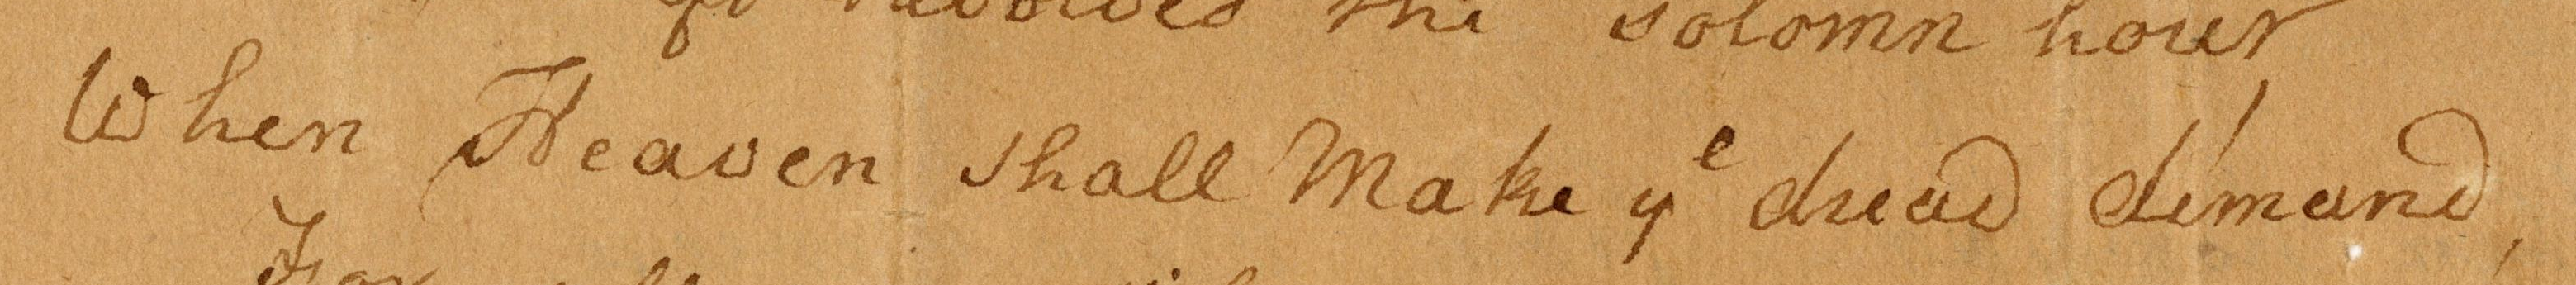When Heaven shall Make y^e dread demand,
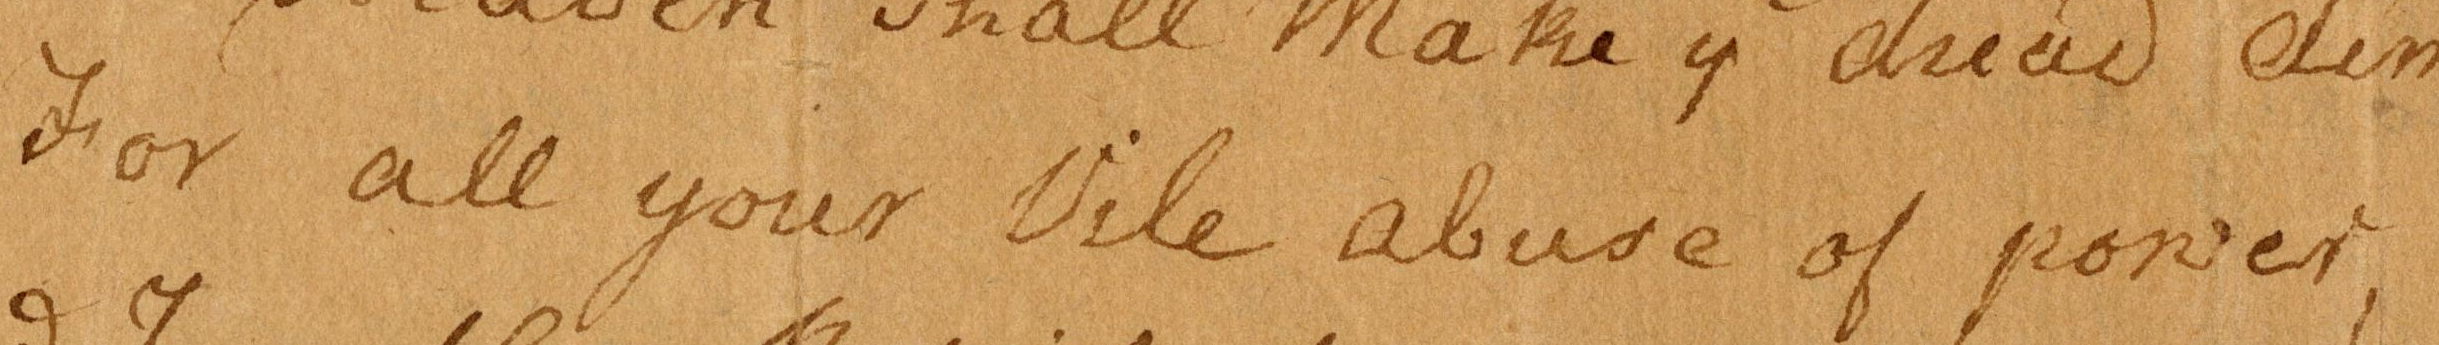For all your Vile abuse of power,
